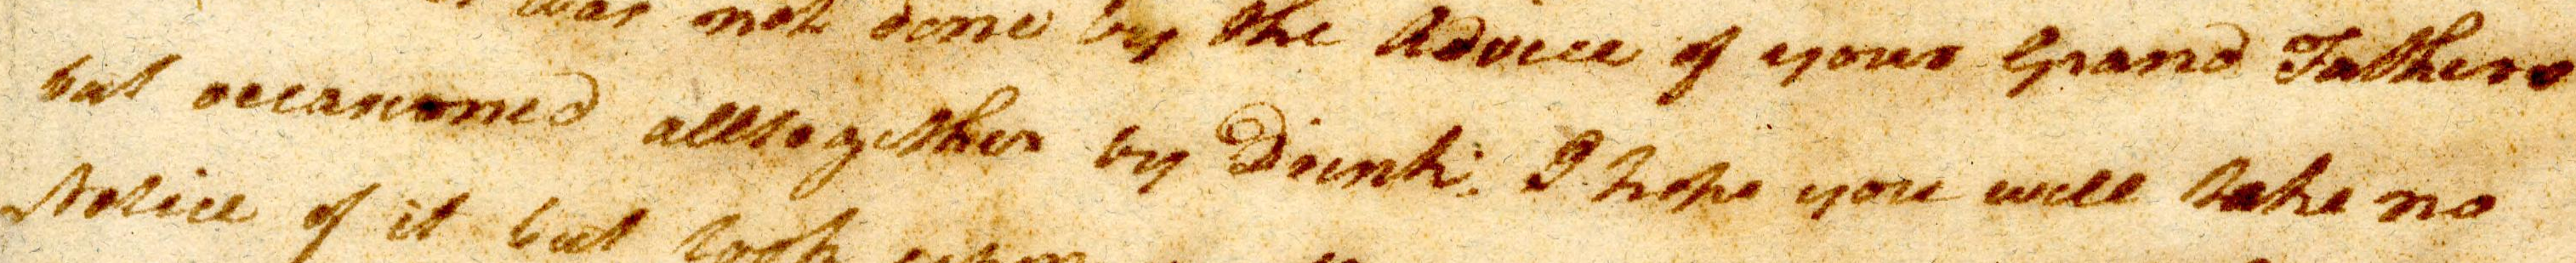but occasioned alltogether by Drink. I hope you will take no
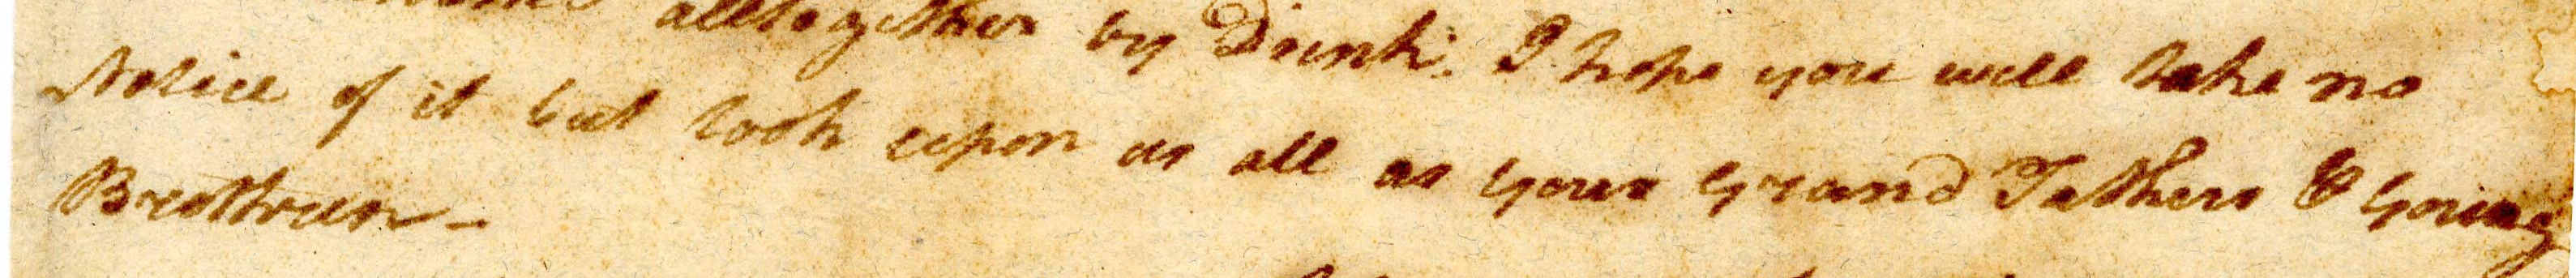Notice of it but look upon us all as your Grand Fathers & Young
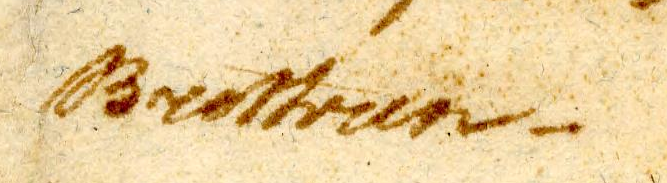Brethren-
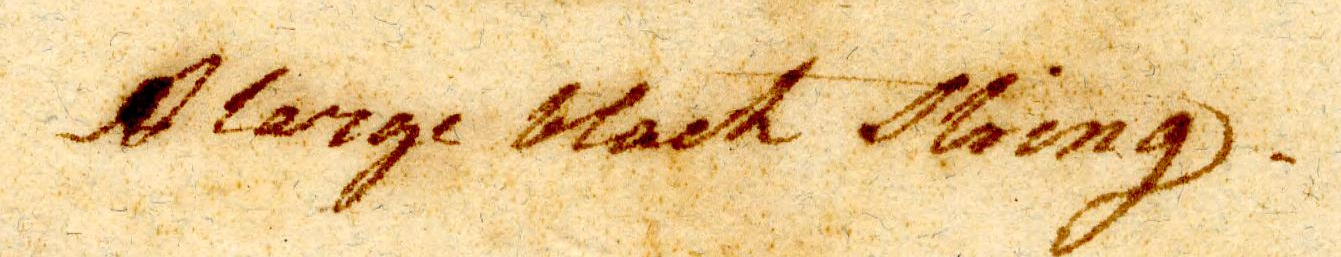A large black String.
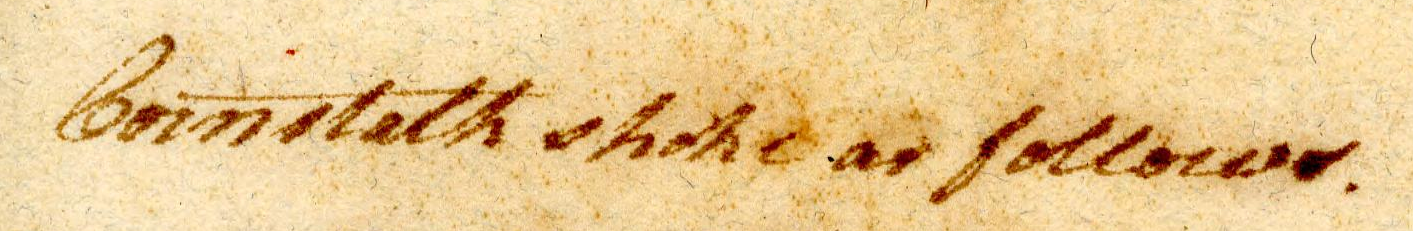Cornstalk spoke as follows.
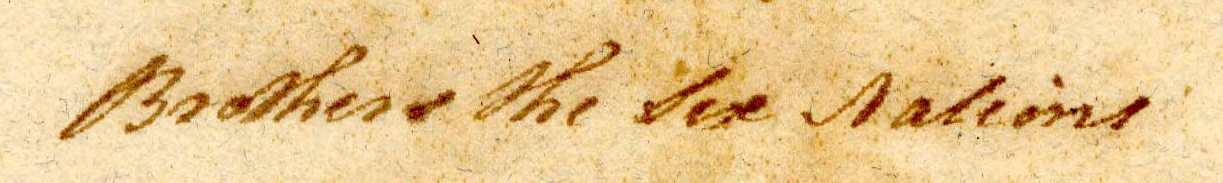Brothers the six Nations
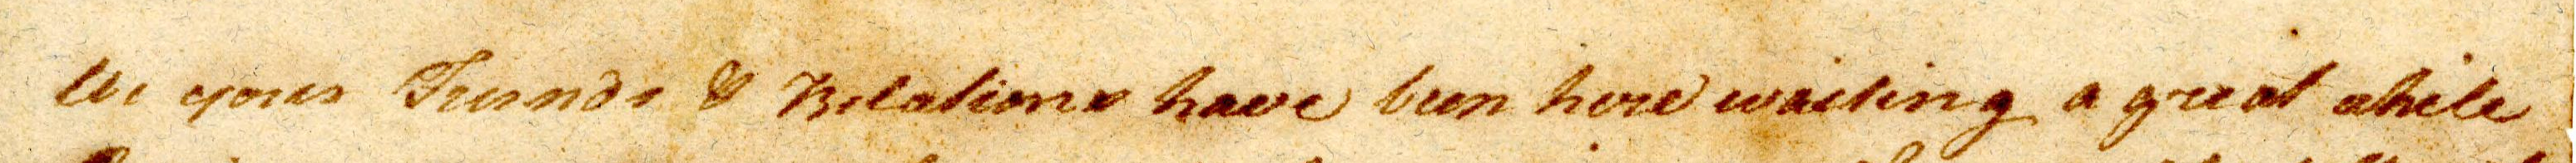We your Friends & Relations have been here waiting a great while
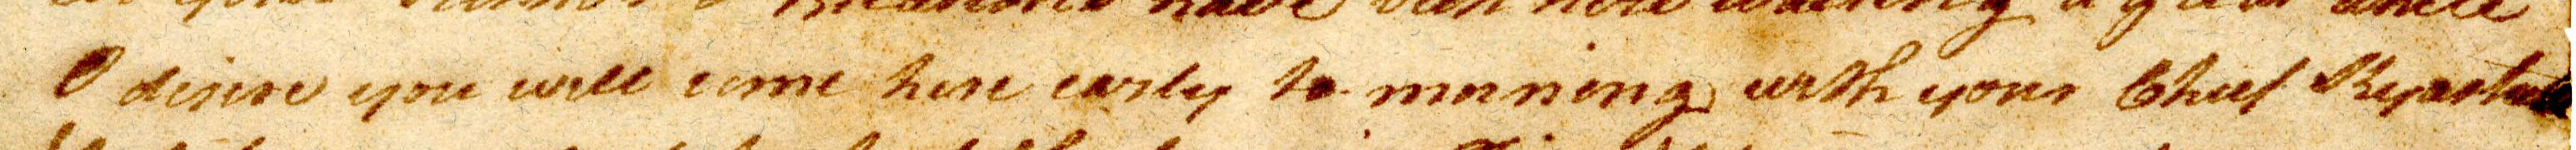I desire you will come here early to morning with your Chief Keyashuta
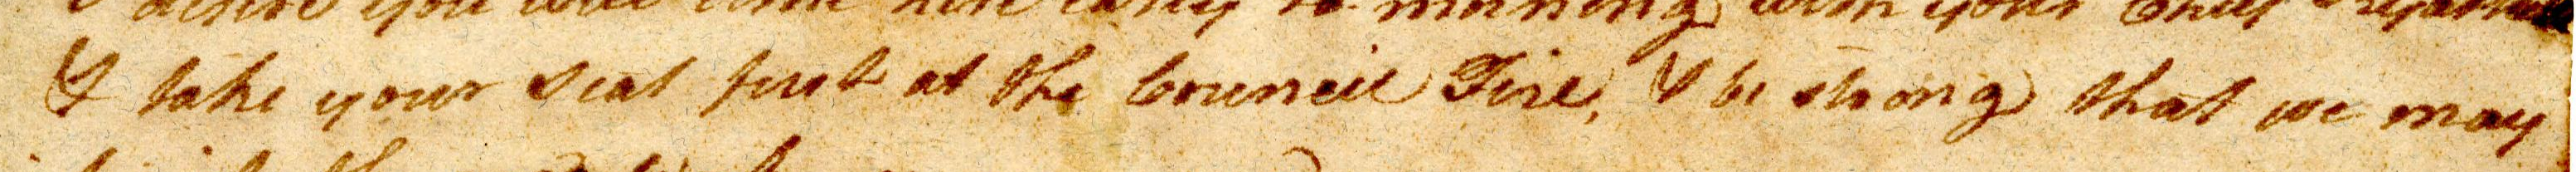& take your seat first at the Council Fire, & be strong that we may
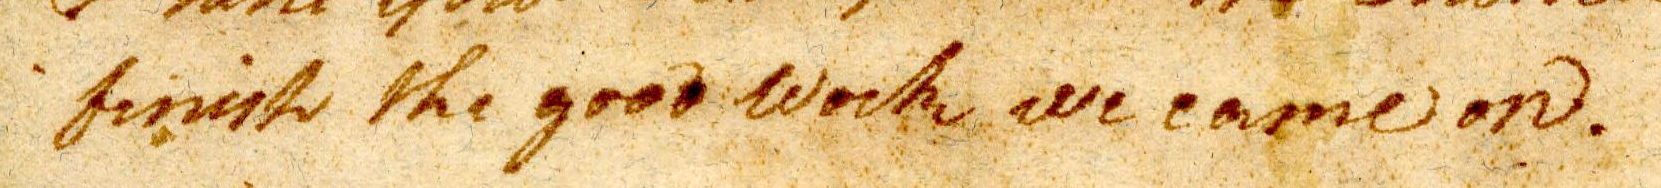finish the good work we came on.
